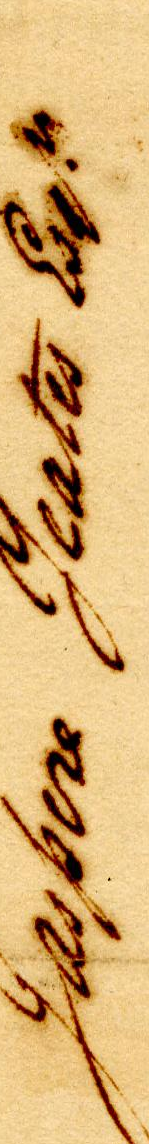Jaspere Yeates Esq^r.
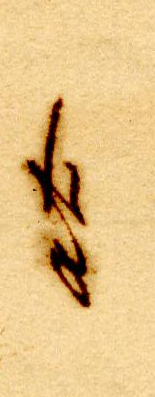at
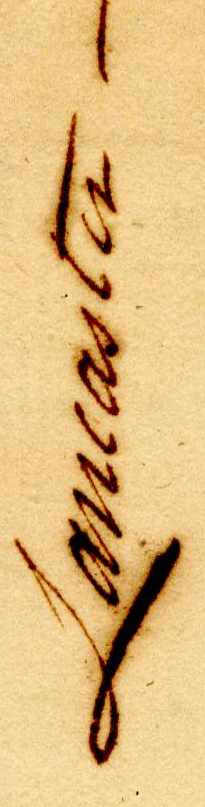Lancaster
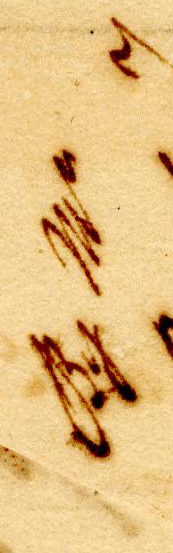By M^r.
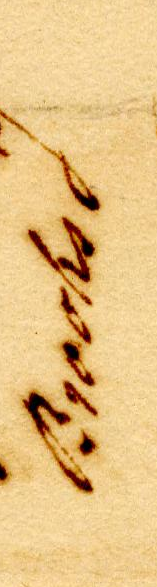Brooks
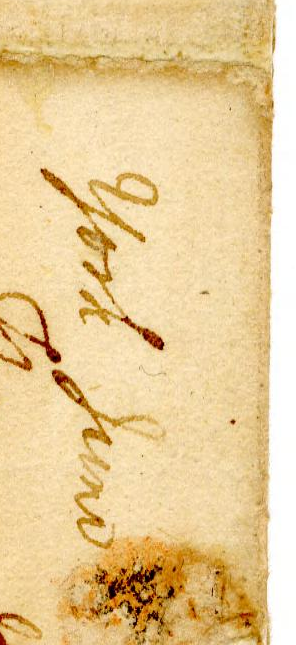York June
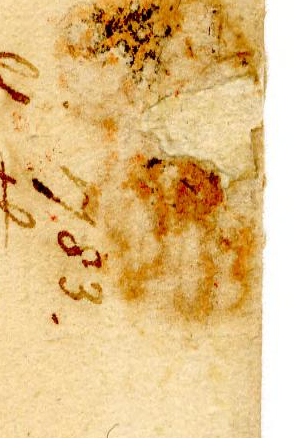1783
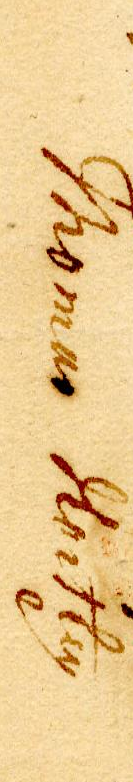Thomas Hartley
